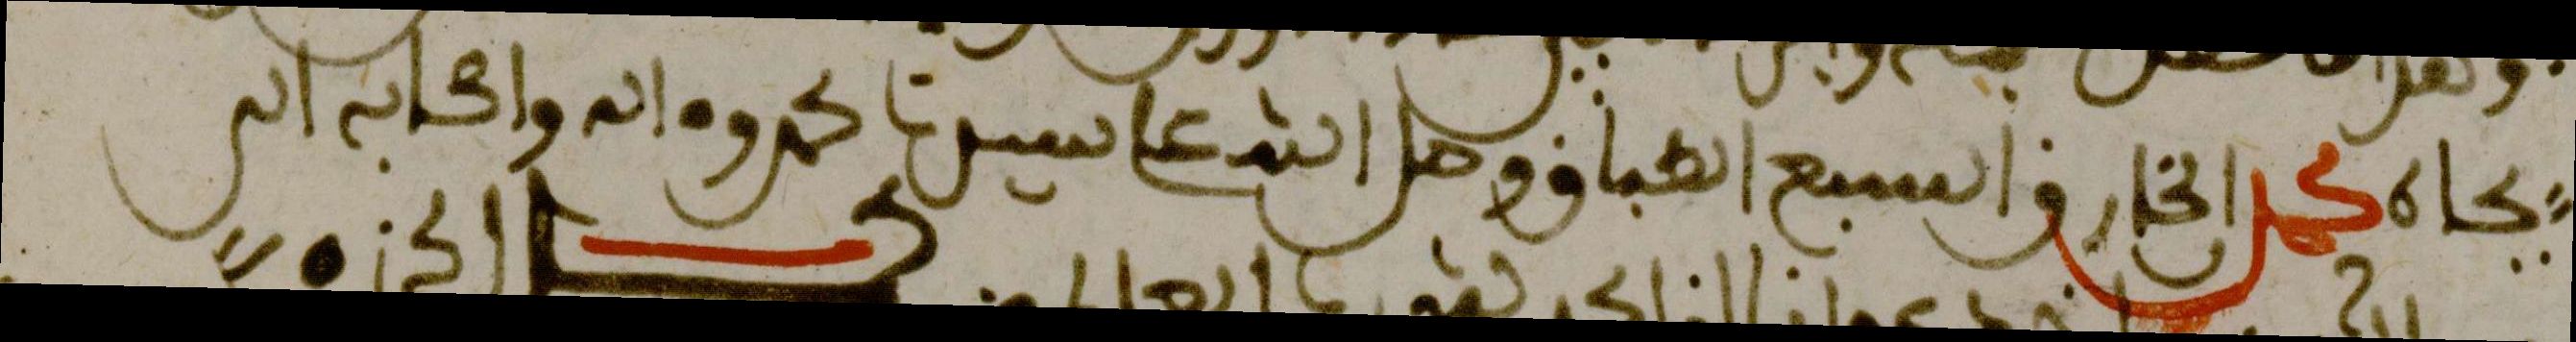بجاه محمد الخارق السبع الطباق وصل الله على سيدنا محمد وءاله واصحابه الى
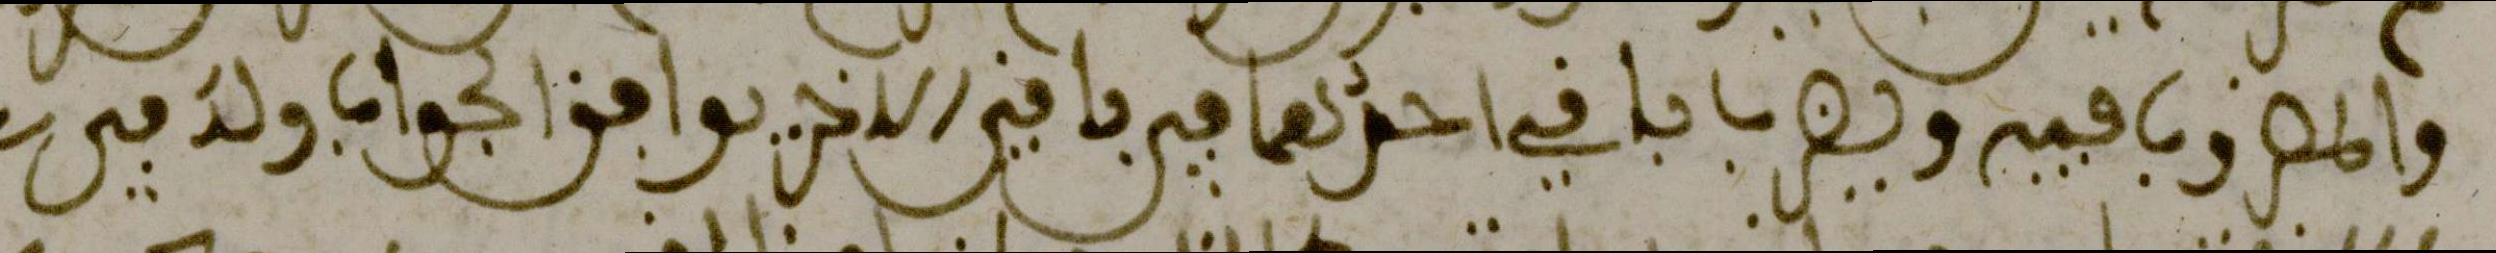والمضروب فيه ويضرب باقي احدهما في باقي الاخر يوافق الجواب ولك في
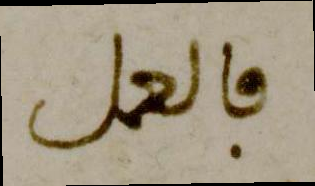فالعمل
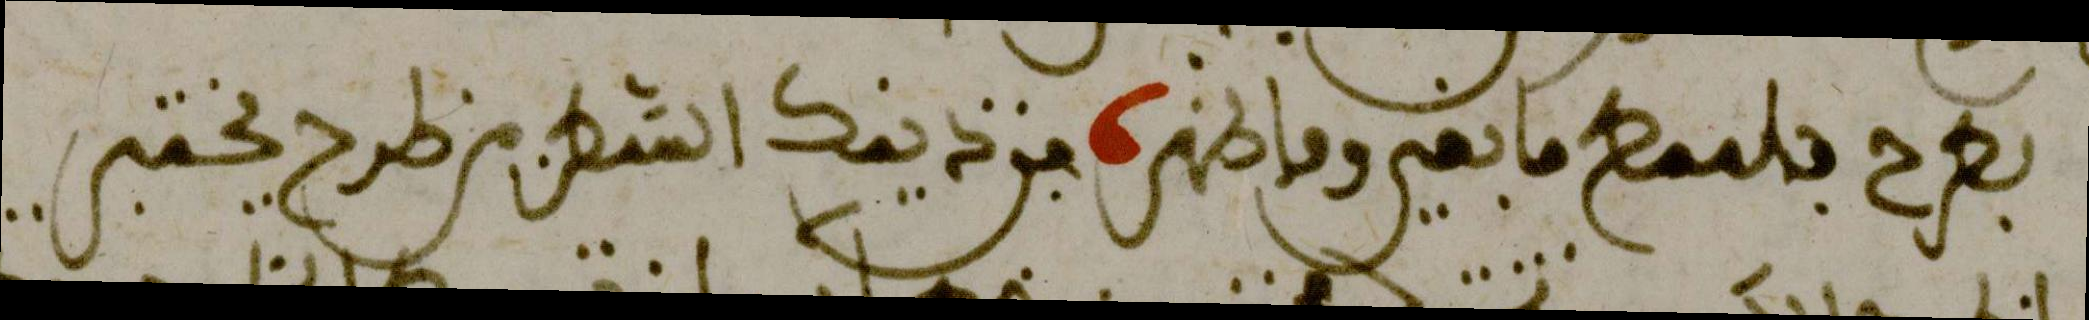بطرح بسط ما بقي وما ظهر من ذينك السّطر من طرح يختبر
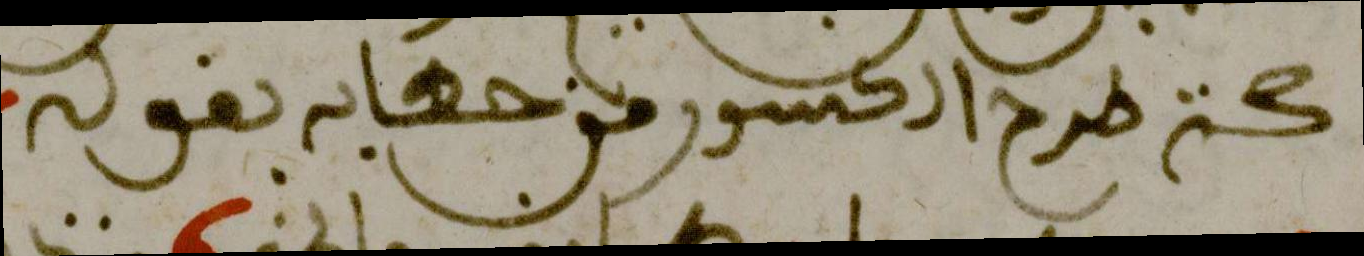صحة طرح الكسور من حطايه بقوله
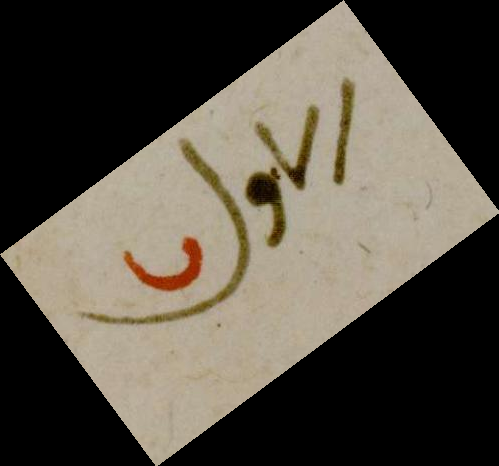الاول
